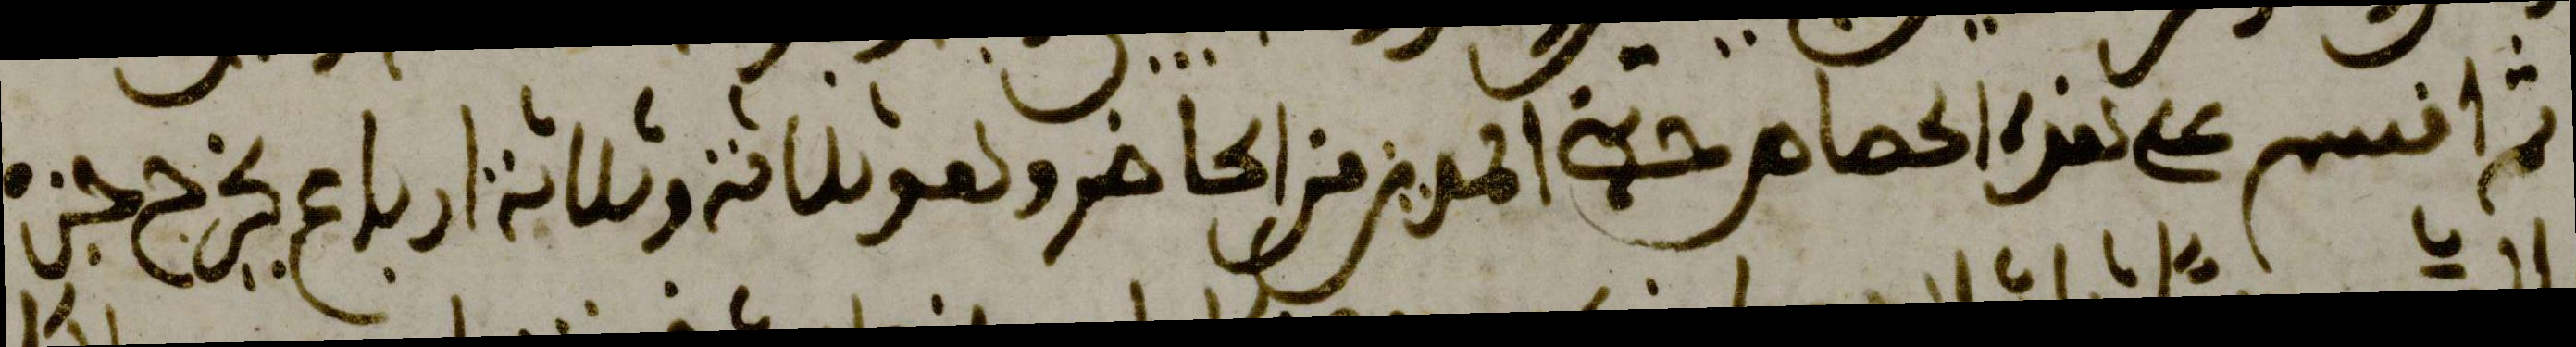ثم اقسم على هذه الحصاص حظ المدين من الحاضر وهو ثلاثة وثلاثة ارباع يخرج جزء
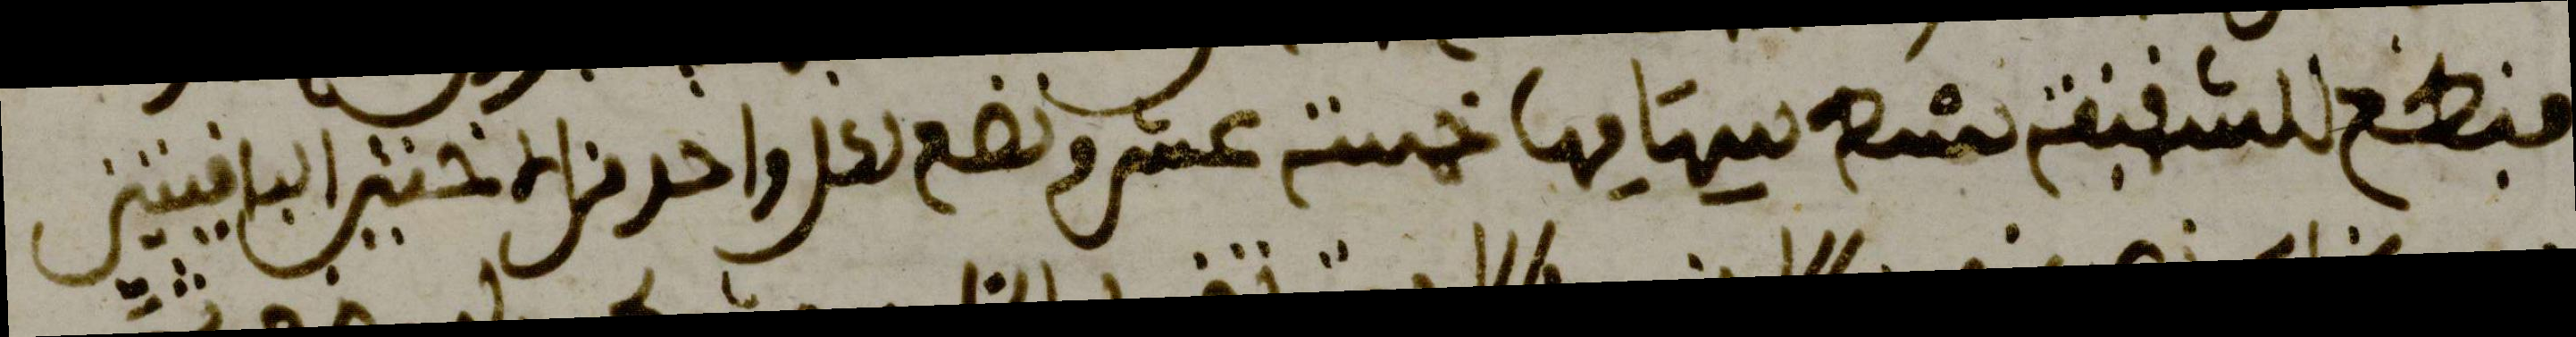فنطع للشقيقة بسط سهامها خمسة عشر ونضع لكل واحد من لا ختين الباقيتين
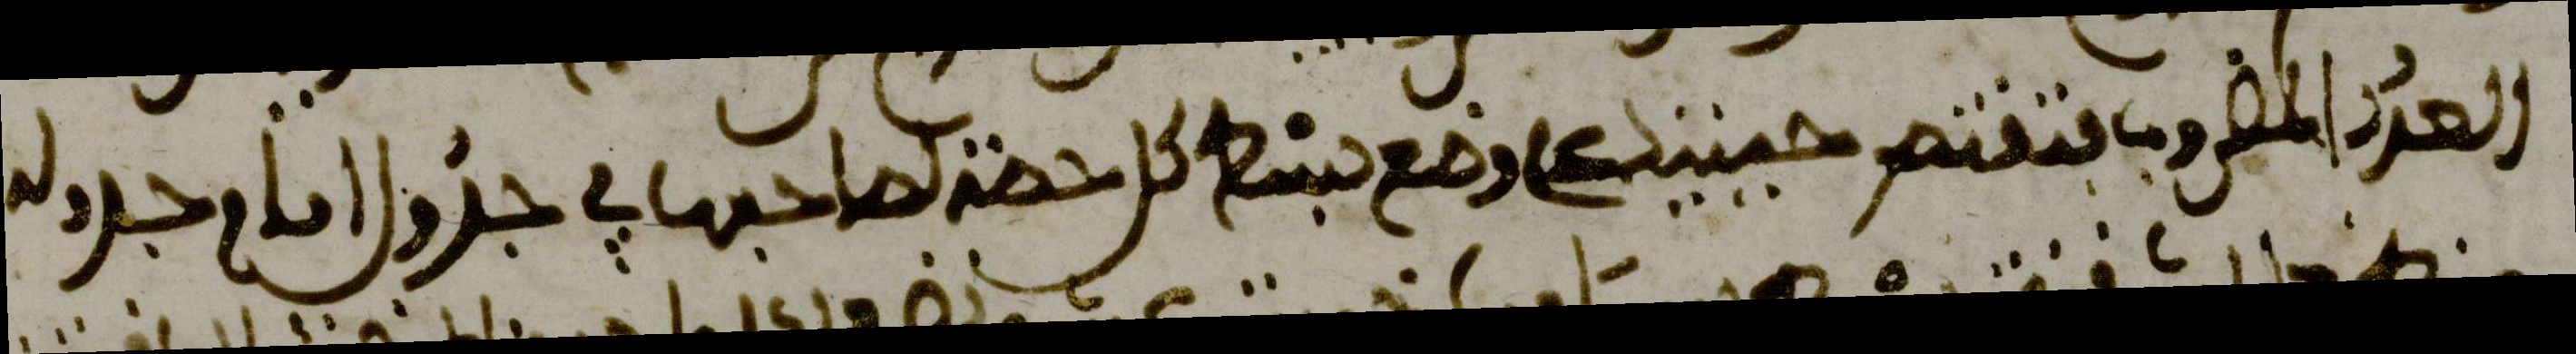العدد المضروب فتقتصر حينيذ على وضع بسط كل حصة لصاحبها في جدول امام جدوله
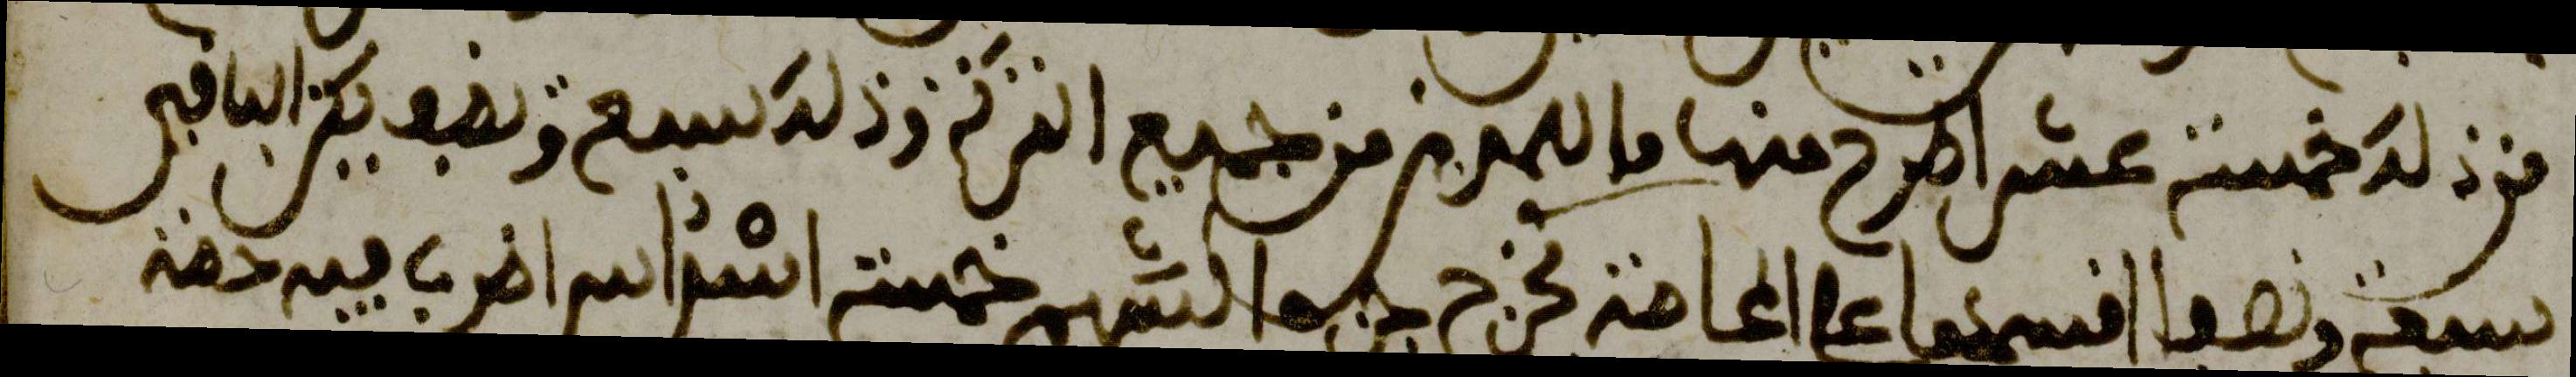من ذلك خمسة عشر اطرح منها ما للمدين من جميع التركة وذلك سبعة ونصف يكم الباقي
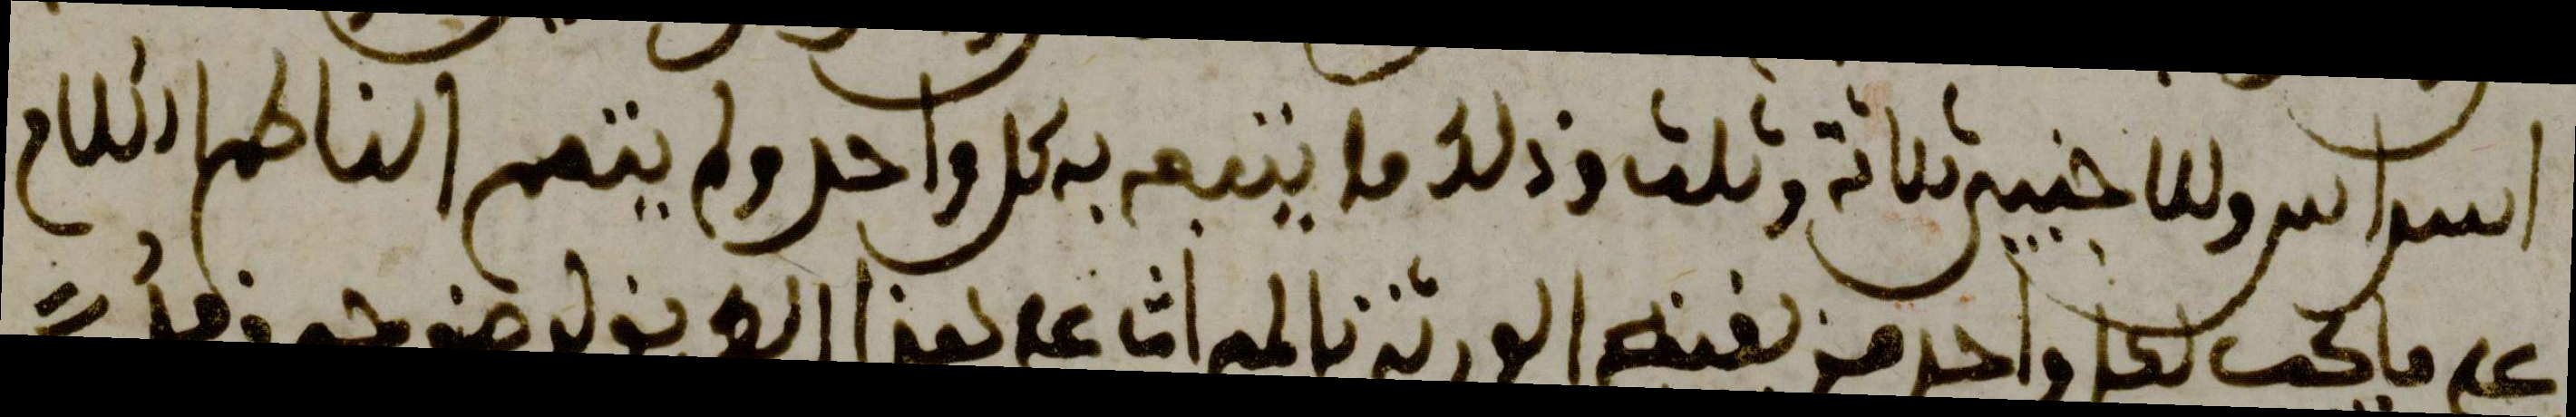اسداس وللاجنبي ثلاثة وثلث وذلك ما يتبعه به كل واحد ولم يتمم الناطم الكلام
